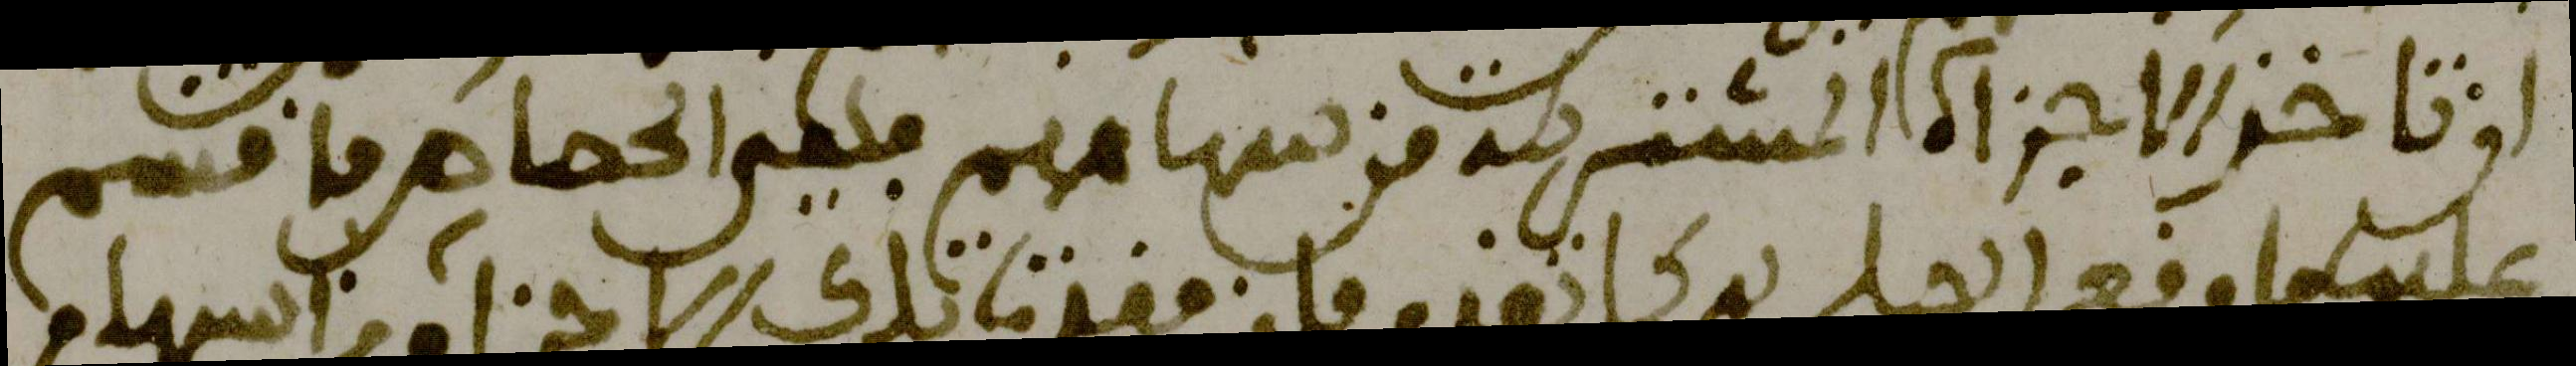ان تاخذ الاجزاء المشترطة من سهامهم فهي الحصاص فاقسم
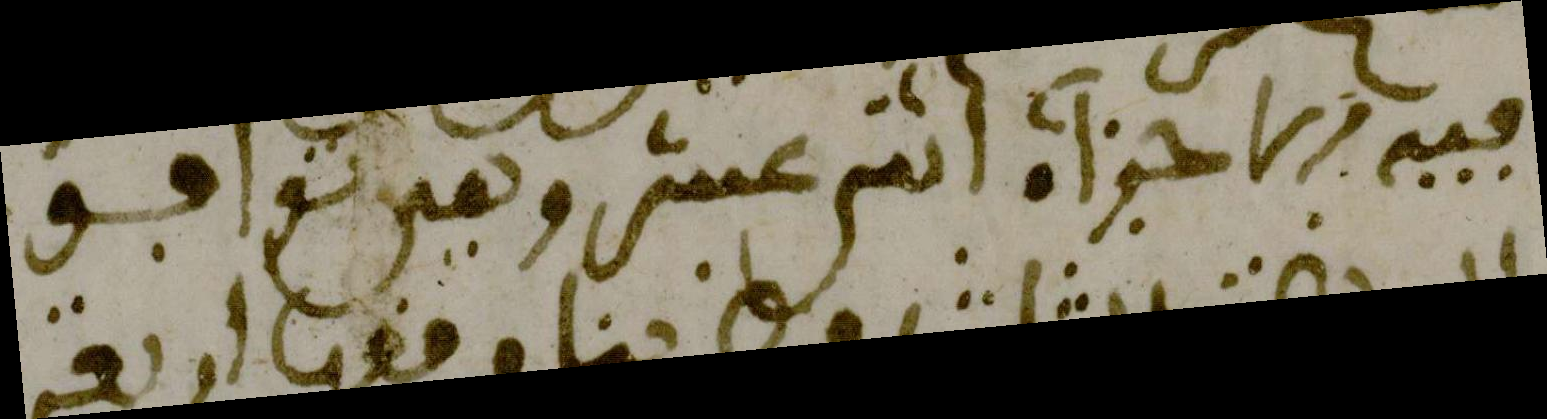فيه الاجزاء اثنا عشر وهي توافق
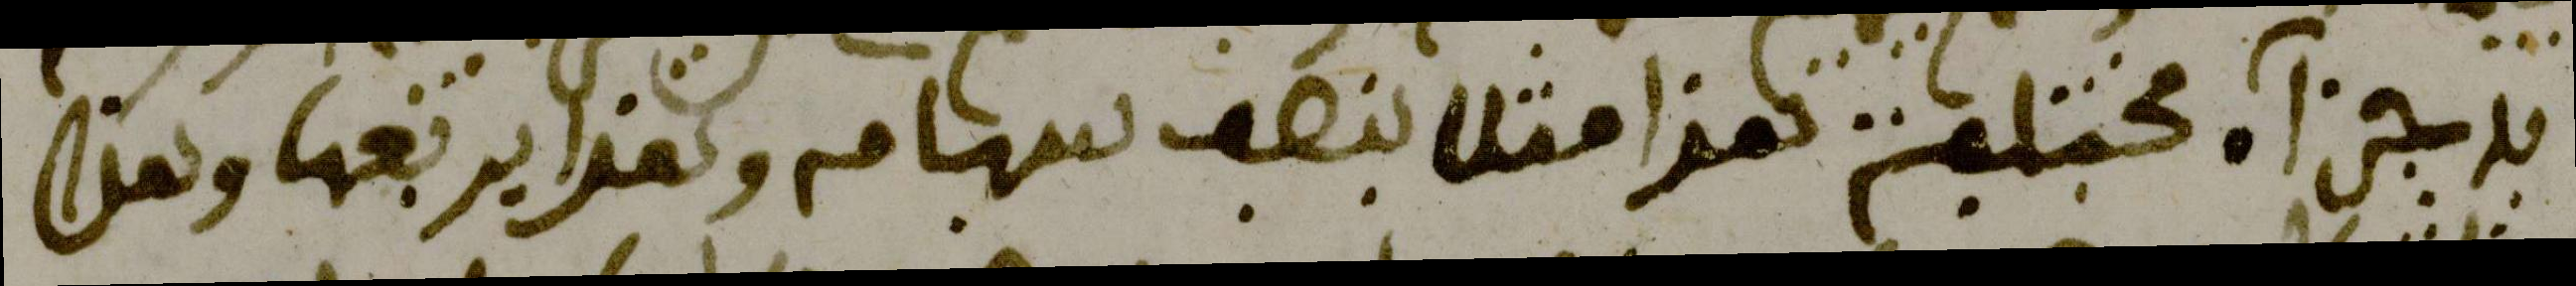باجزاء مختلفة هذا مثلا بنصف سهامه وهذا بربعها وهذا
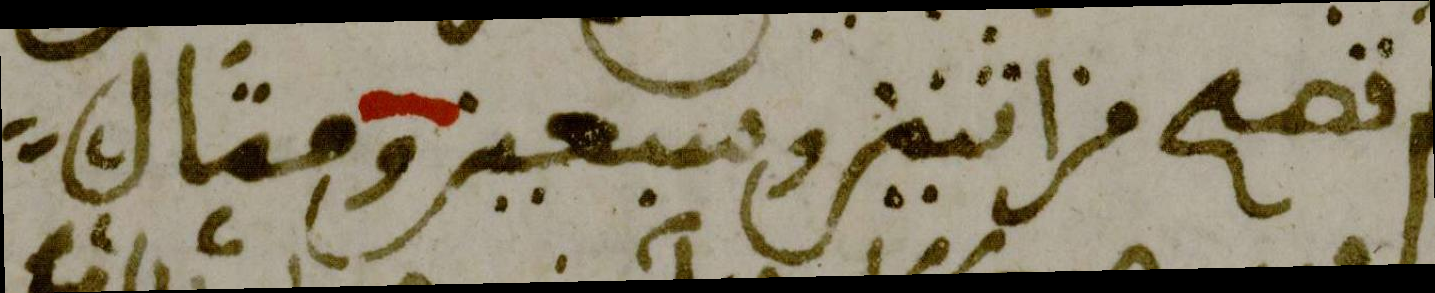تصح من اثنين وسبعين وَمثال
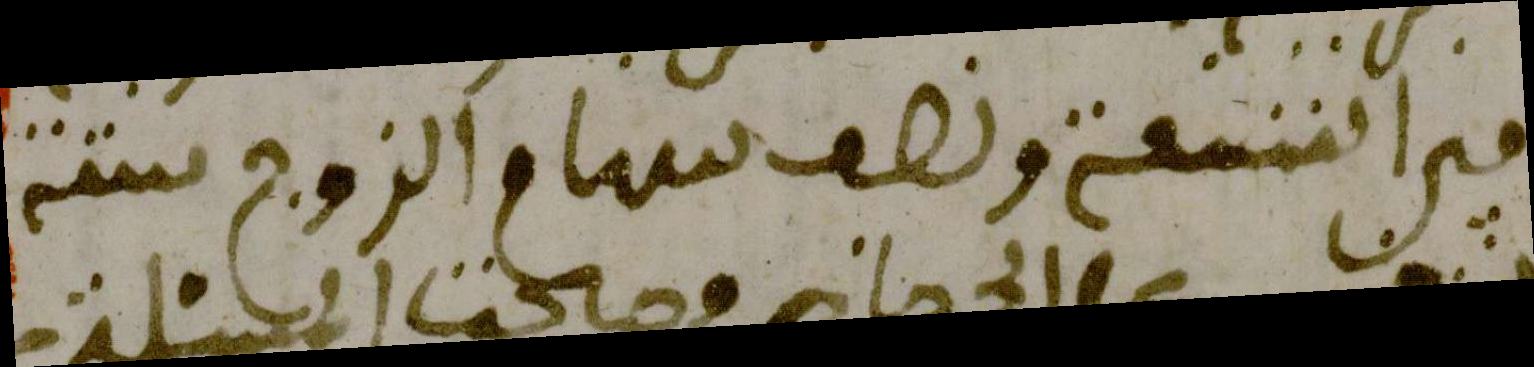في التسعة ونصف سهام الزوج ستة
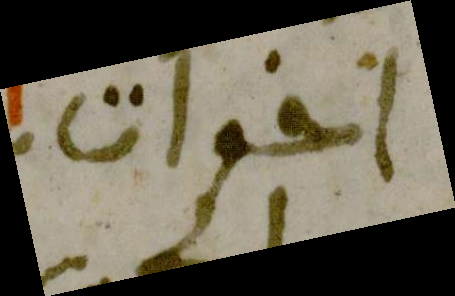اخوات
